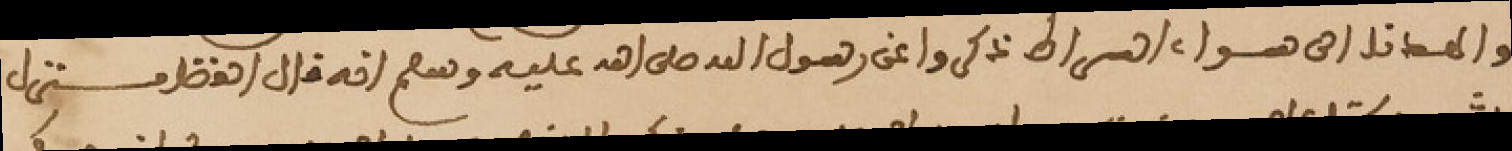واهدنا الى سواء السراط ذكروا عن رسول الله صلى الله عليه وسلم انه قال الفضل منزل
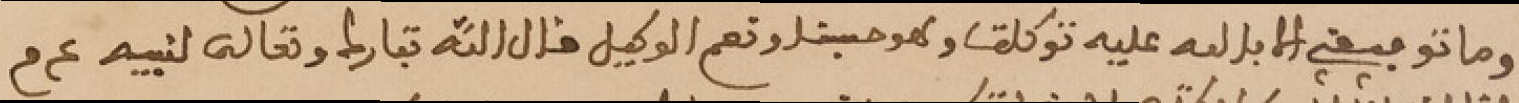وما توفيقى إلا بالله عليه توكلت وهو حسبنا ونعم الوكيل قال الله تبارك وتعالى لنبيه ع م
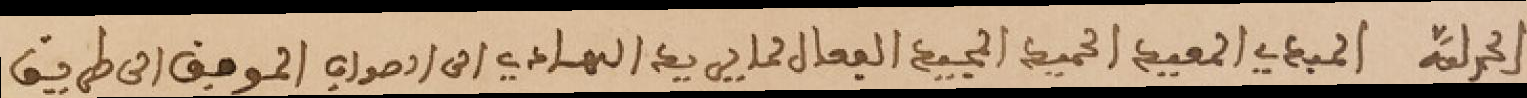الحمد لله المبدي المعيد الحميد المجيد الفعال لما يريد الهادي الى الصواب الموفق الى الطريق
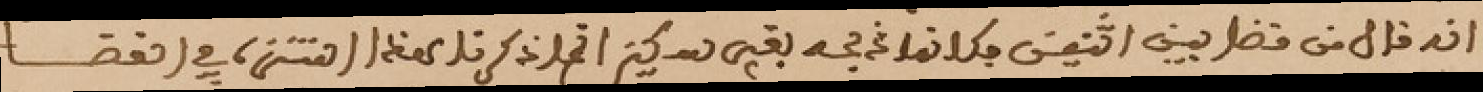انه قال من قضى بين اثنين فكانما ذبحه بغير سكين # ذكرنا هذا اهنتنى في القضاء
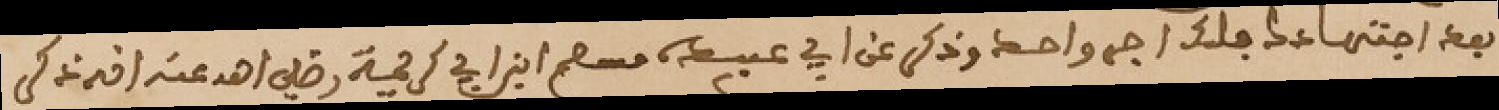بعد اجتهادك فلك اجر واحد وذكر عن ابي عبدة مسعم ابن ابي كريمة رضي الله عنه انه ذكر
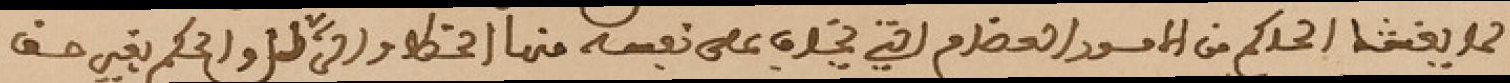هو # احدكم من الامور العظم التي يخاف على نفسه منها الحظ # # والحكم بغير حق
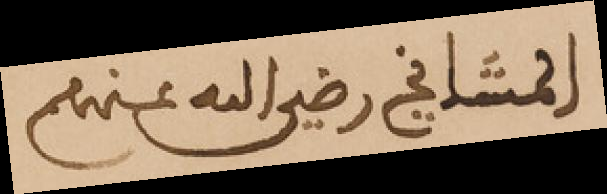المشايخ رضي الله عنهم
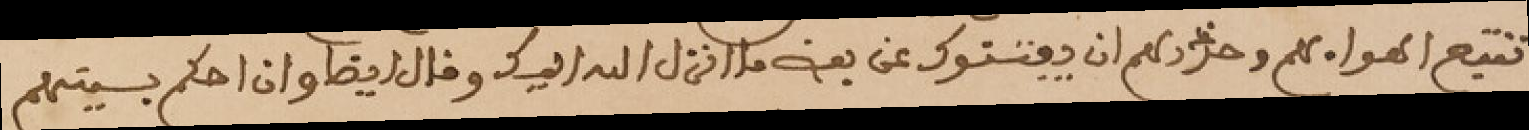تتبع اهواءهم وحذرهم ان يفتنوك عن بعض ما انزل الله اليك وقال ايضا وان احكم بينهم
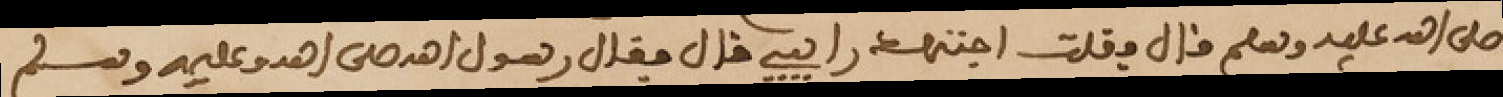صلى الله عليه وسلم قال فقلت اجتهد رايي قال يقال رسول الله صلى الله عليه وسلم
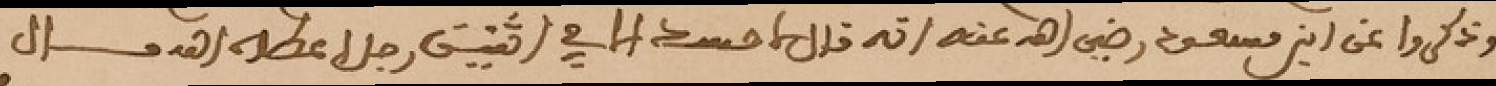وذكروا عن ابن مسعود رضي الله عنه انه قال لا حسد الا في اثنتين رجل أعطاه الله مال فهو ينفقه
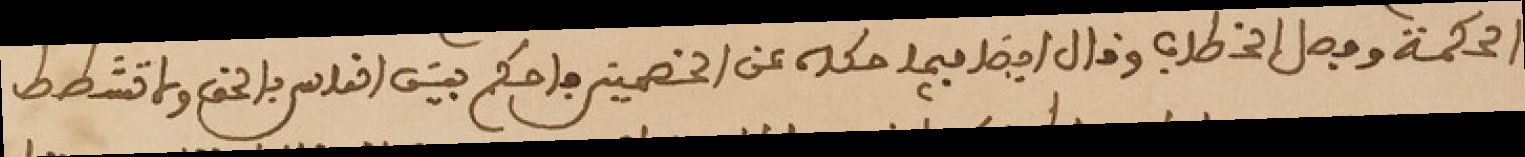الحكمةوفصل الخطاب وقال ايضا فما حكاه عن الخصمين فاحكم بين بالحق ولا تشطط
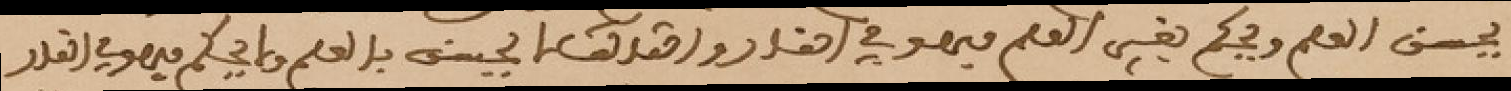يحسن العلم ويحكم بغير العلم فهو في القدر و # بحسنه بالعلم ولا يحكم فهو في الضلال
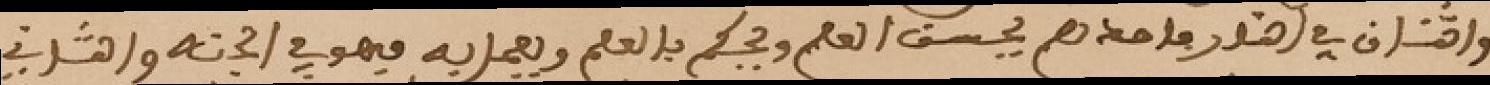واثنان في النار فاحدهم يحسن العلم ويحكم بالعلم ويعمل به فهو في الجنة و الثني
